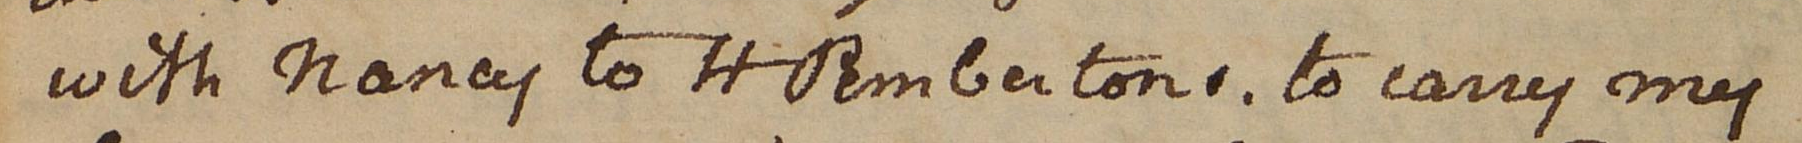with Nancy to H Pembertons. to carry my
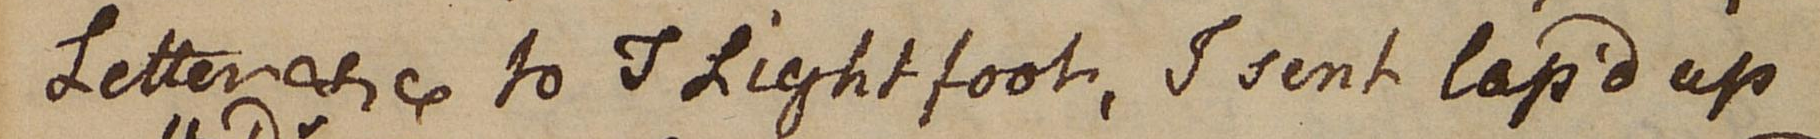Letter &c to T Lightfoot, I sent lap'd up
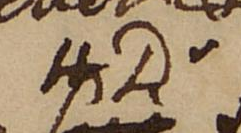HD^s
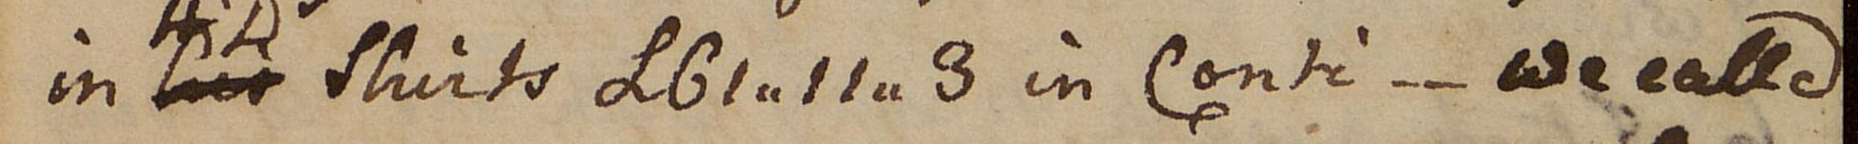in [her] Shirts £61..11..3 in Conti-- we calld
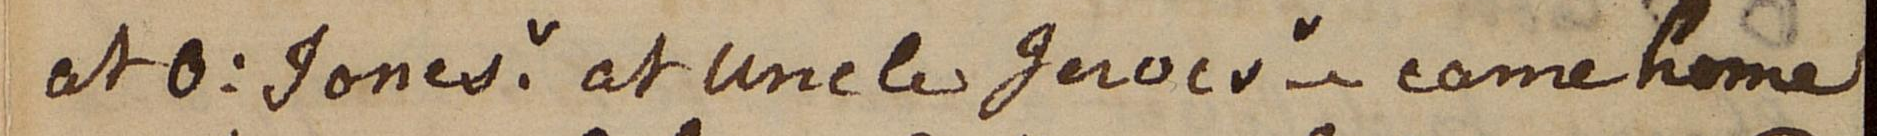at O: Jones^s. at Uncle Jervis^s- came home
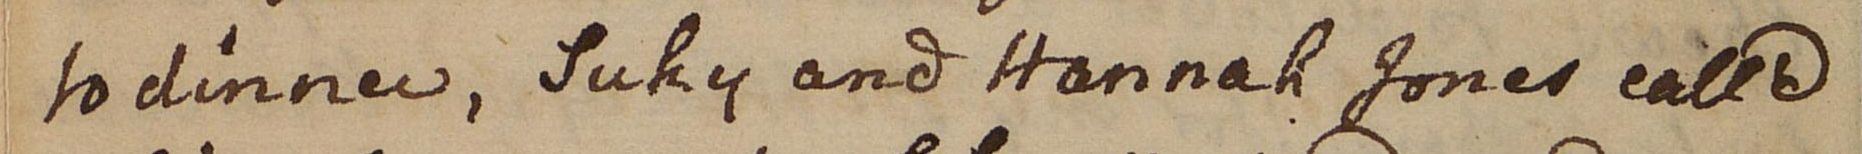to dinner, Suky and Hannah Jones call'd
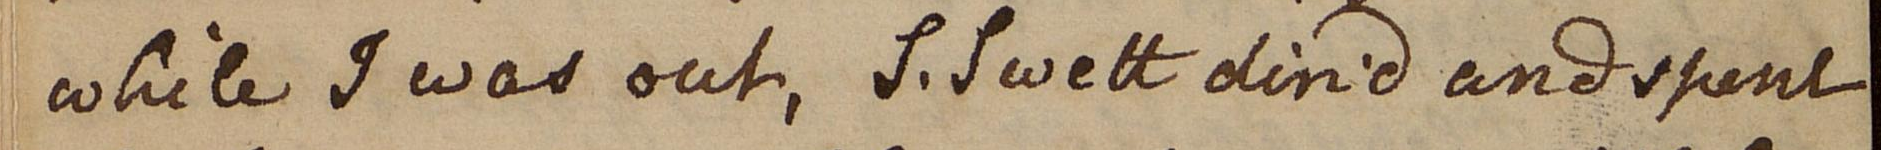while I was out, S. Swett din'd and spent
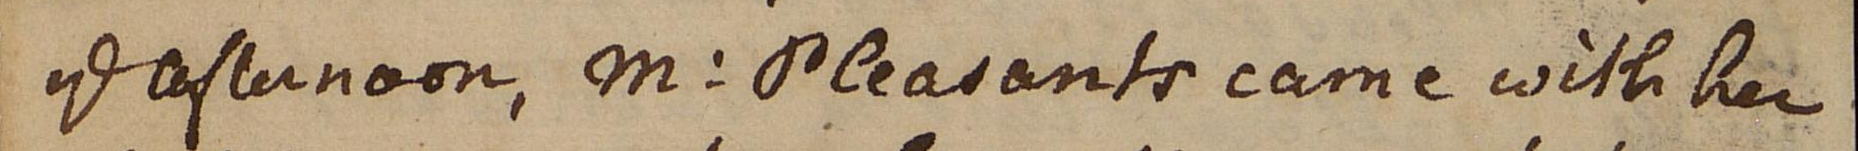y^e Afternoon, M: Pleasants came with her
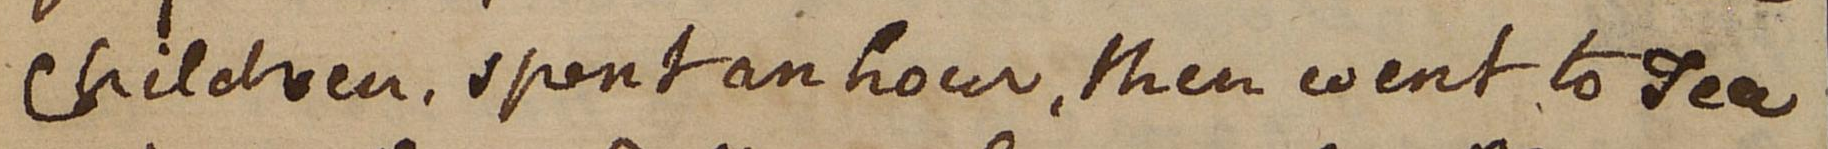Children, spent an hour, then went to Tea
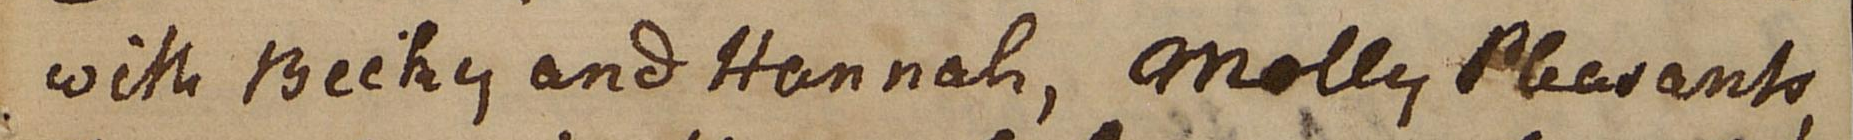with Becky and Hannah, Molly Pleasants,
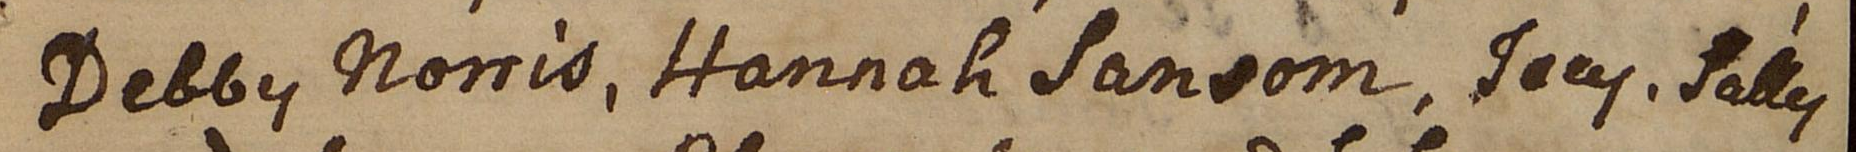Debby Norris, Hannah Sansom, Joey. Sally
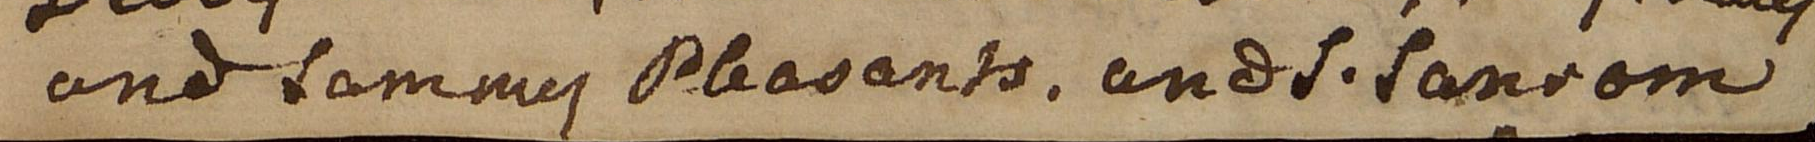and Sammy Pleasants. and S. Sansom
